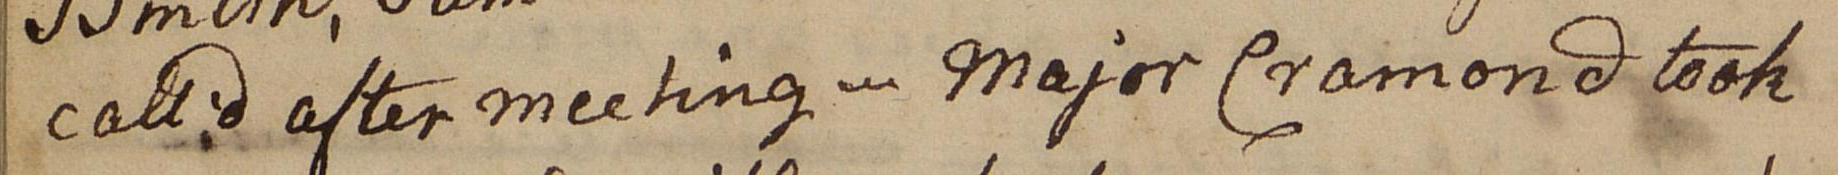call'd after meeting- Major Cramond took
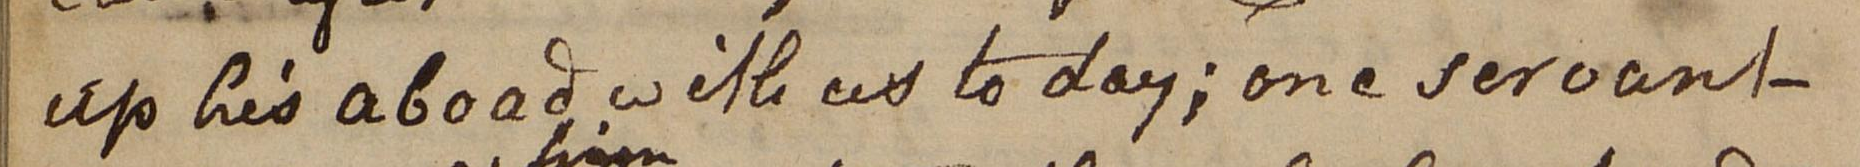up his aboad with us to day; one servant-
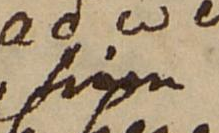him
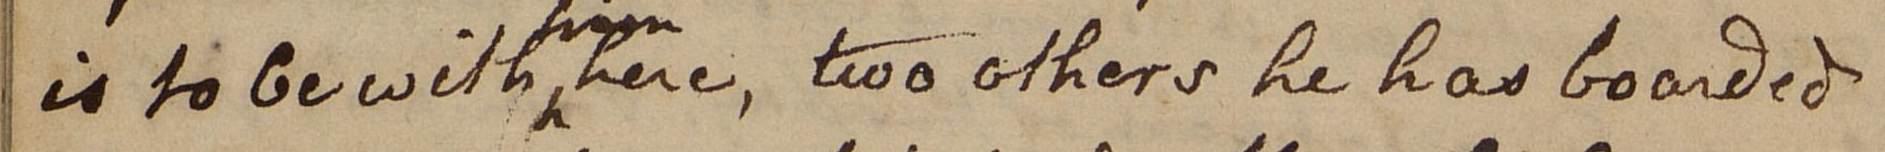is to be with ^ here, two others he has boarded
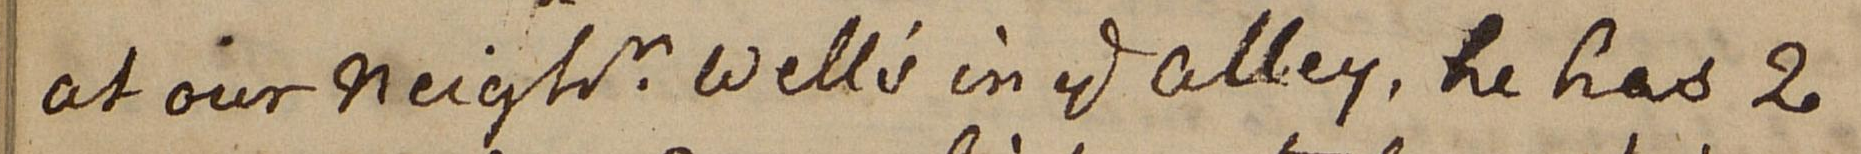at our Neigh^r. Well's in y^e alley, he has 2
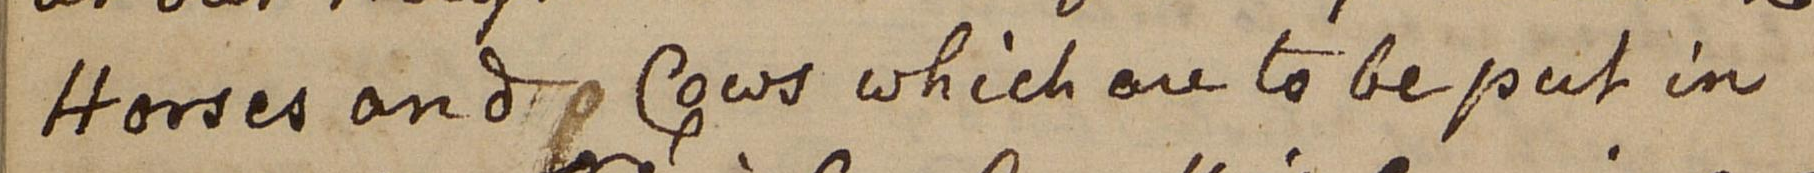Horses and Cows which are to be put in
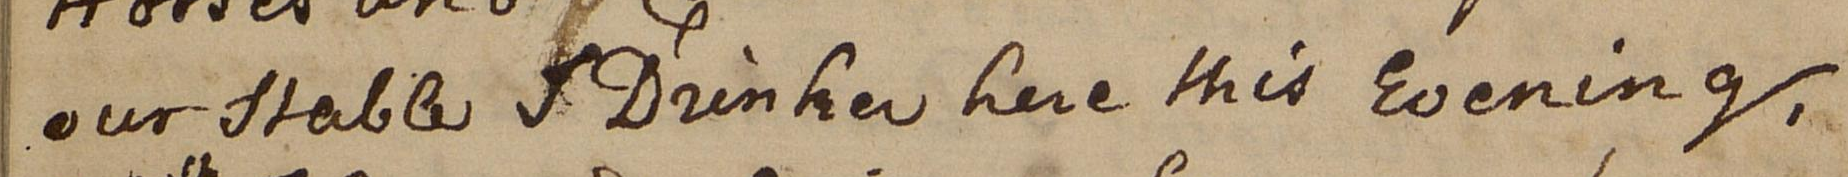our Stable I Drinker here this Evening,
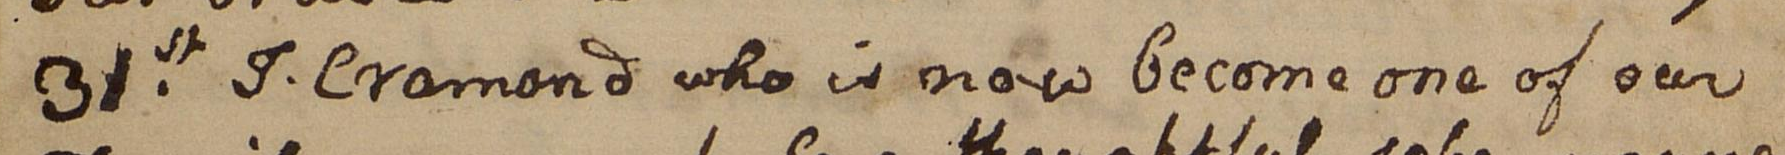31^st. S: Cramond who is now become one of our
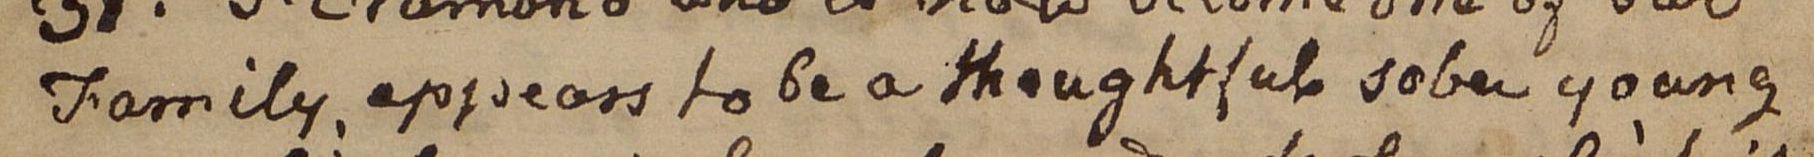Family, appears to be a thoughtful sober young
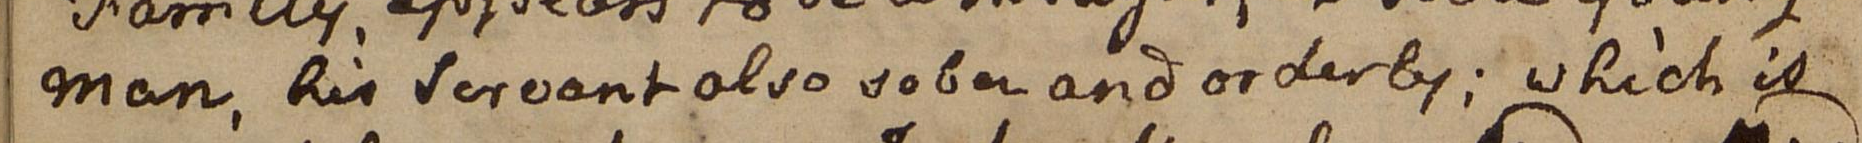man, his servant also sober and or derby; which is
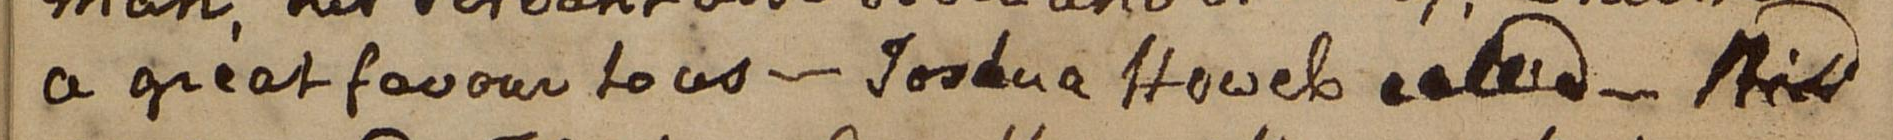a great favour to us- Joshua Howel call'd - Rich^d.
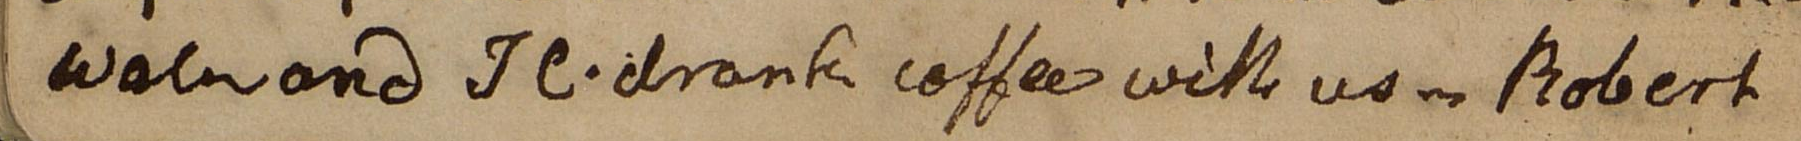Waln and JC drank coffee with us- Robert
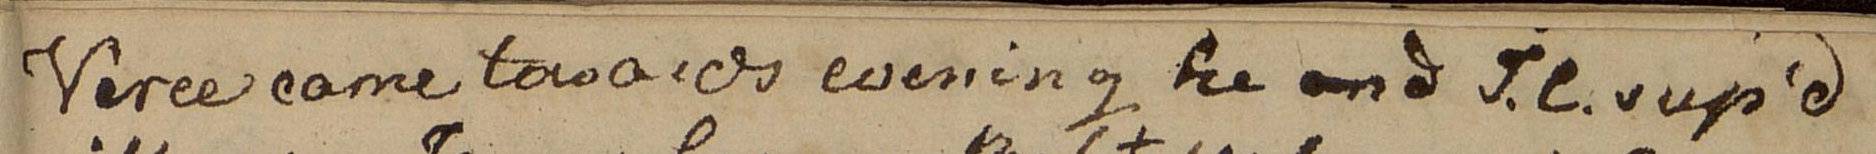Varee came towards evening he and J.I. sup'd
